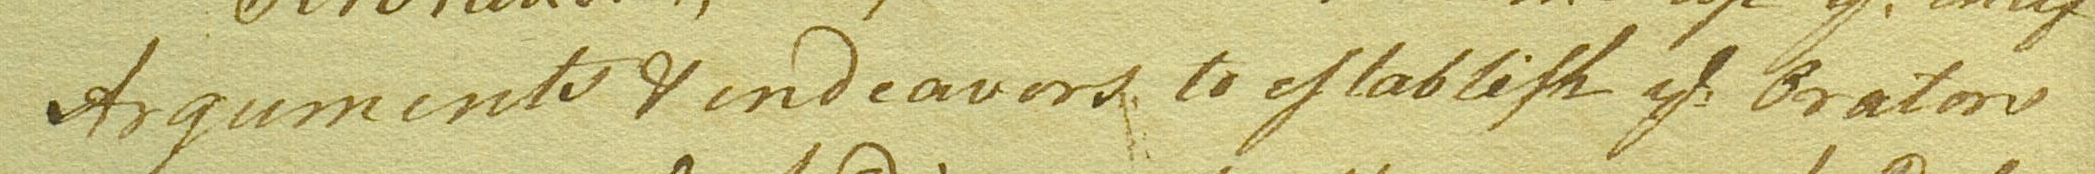Arguments & endeavors to establish y^e Orators
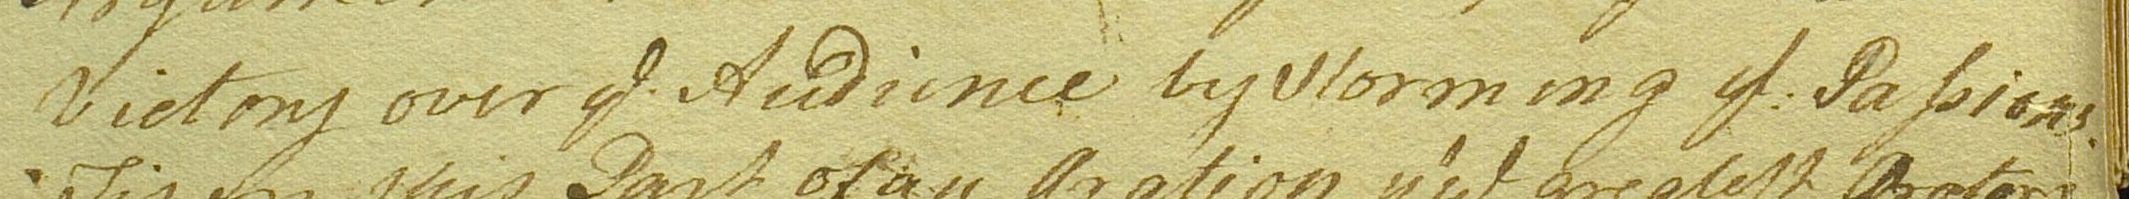Victory over y^e. Audience by storming y^e: Passions.
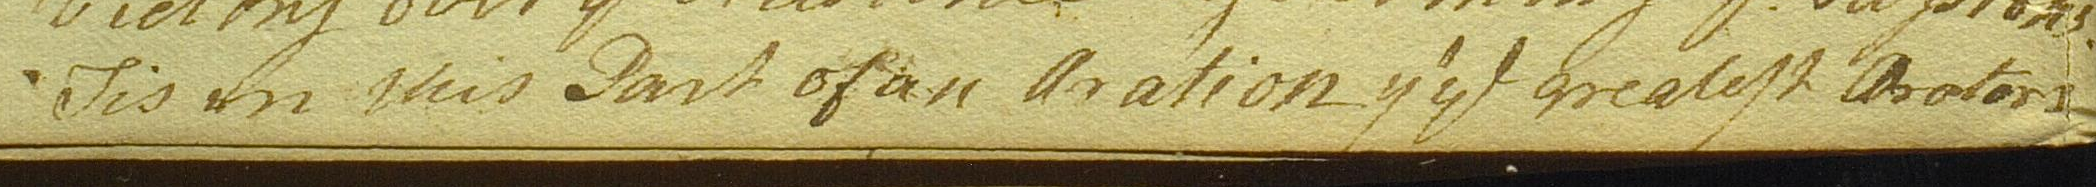Tis in this Part of an Oration y^t y^e greats Orators
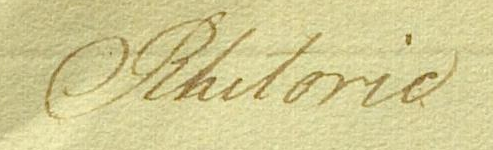Rhetoric
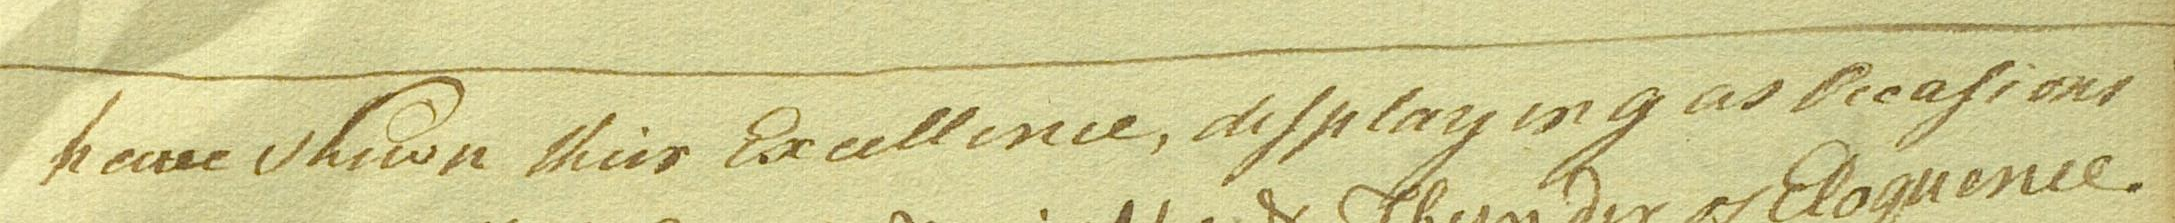have shown their Excellence, displaying as Occasions
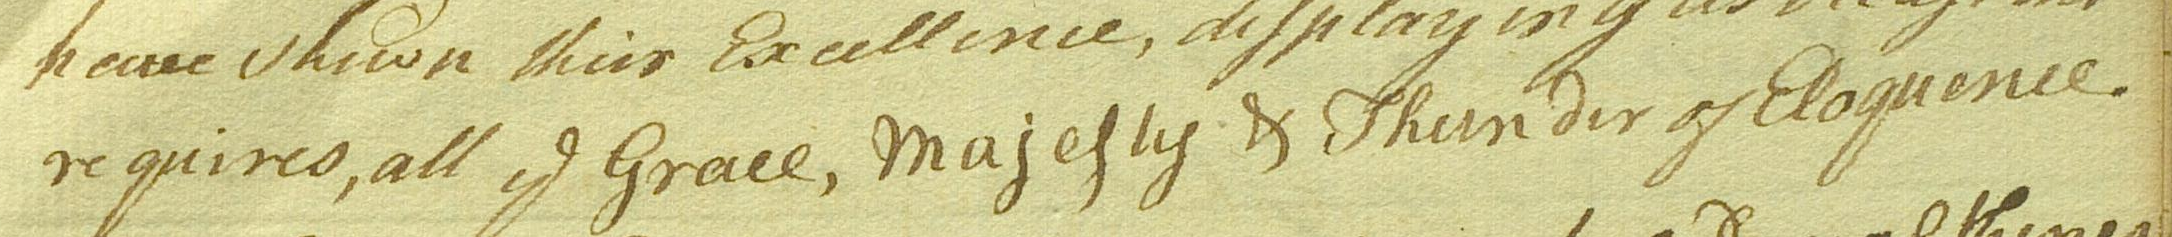requires, all y^e Grace, Majesty & Thunder of Eloquence.
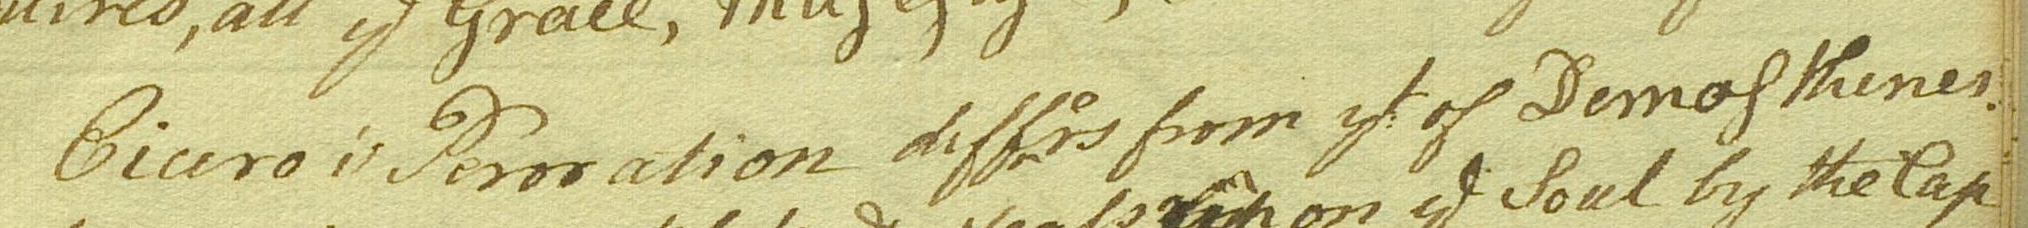Cicero's Peroration diff^ers from y^e of Demosthenes
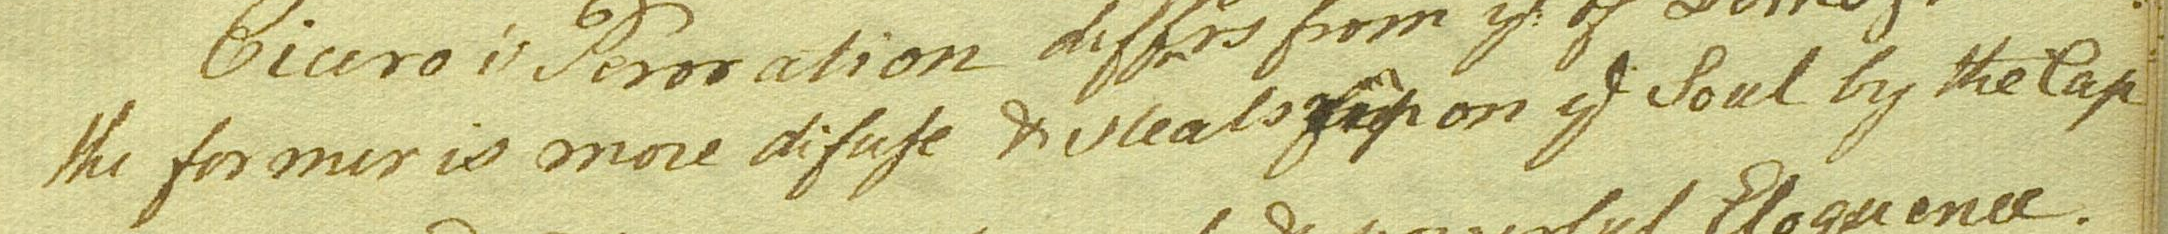the former is more difuse & steals [up]on y^e Soul by the Cap
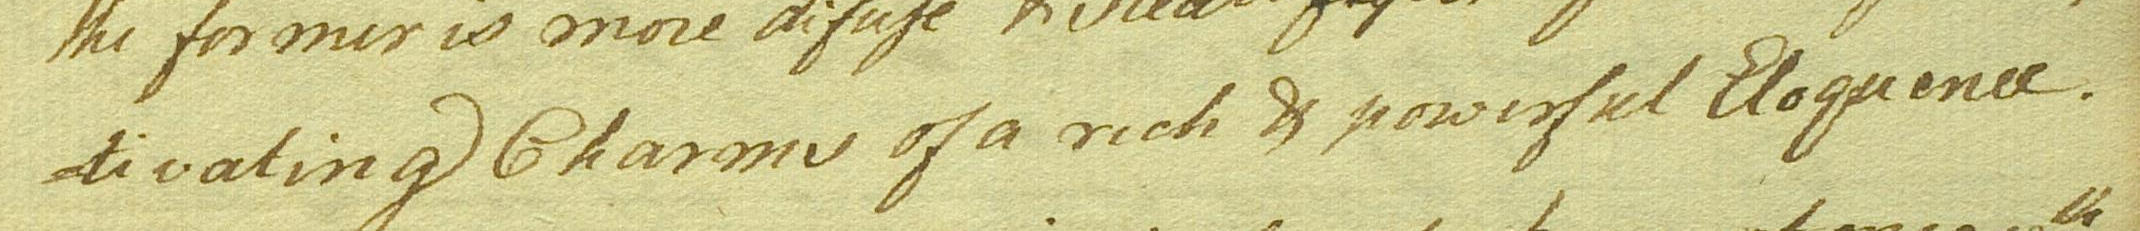-tivating Charm of a rich & powerful Eloquence.
